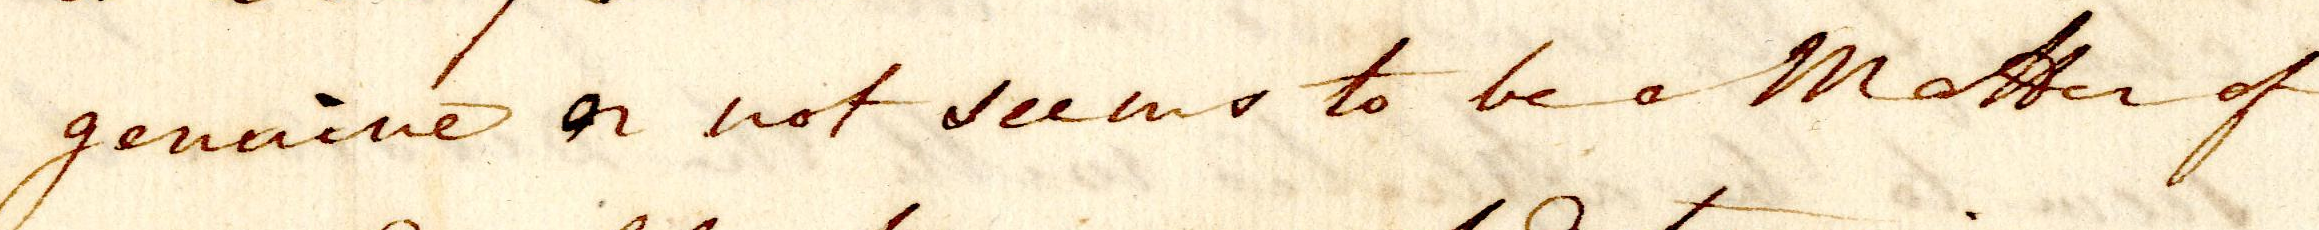genuine or not seems to be a Matter of
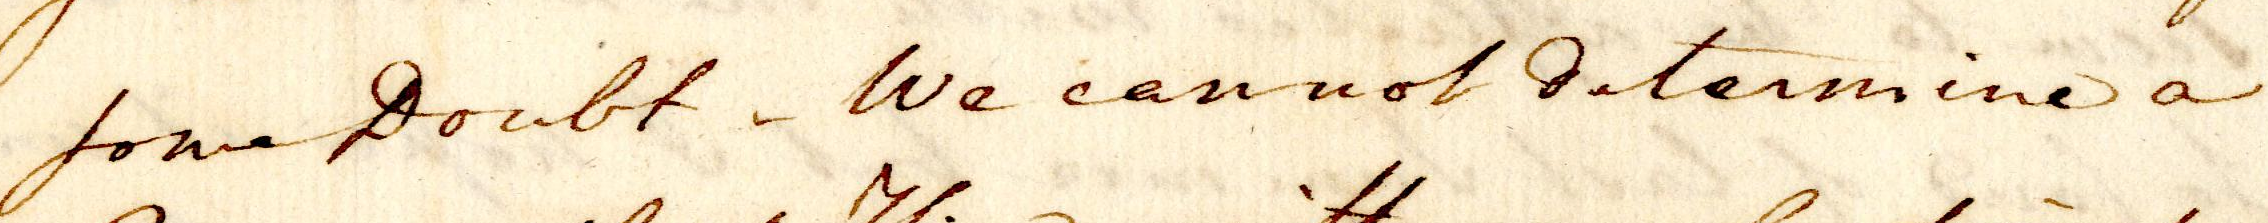some doubt. We cannot determine a
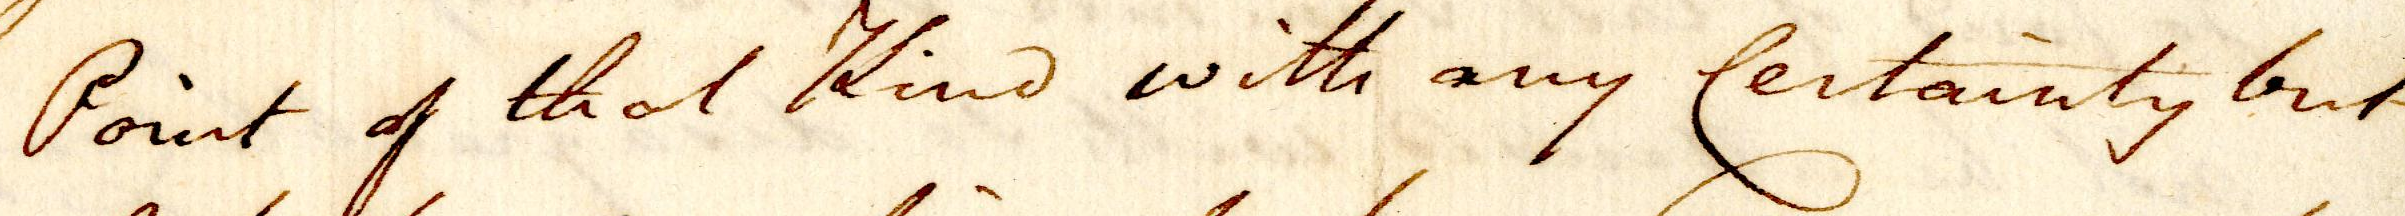Point of that kind with any Certainty but
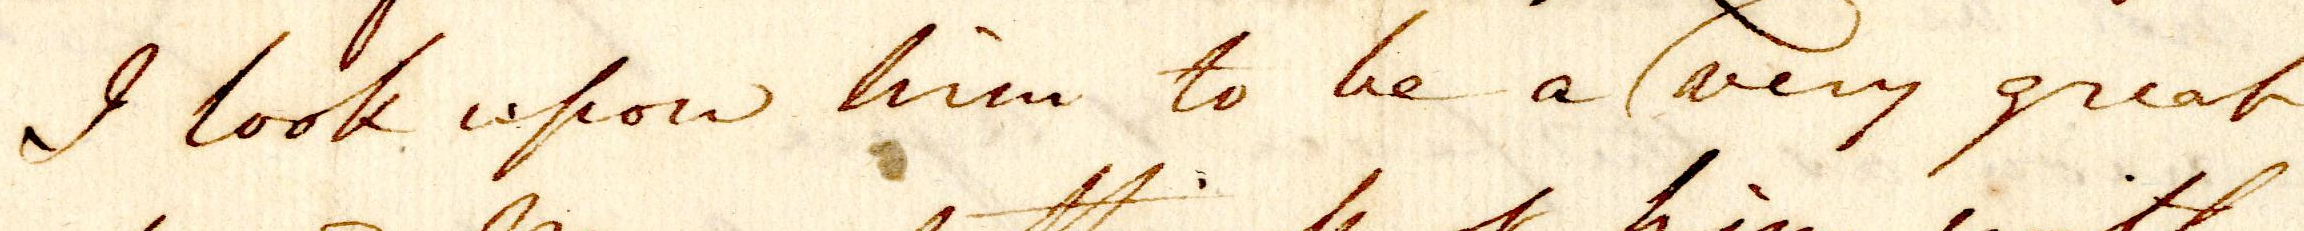I look upon him to be a very great
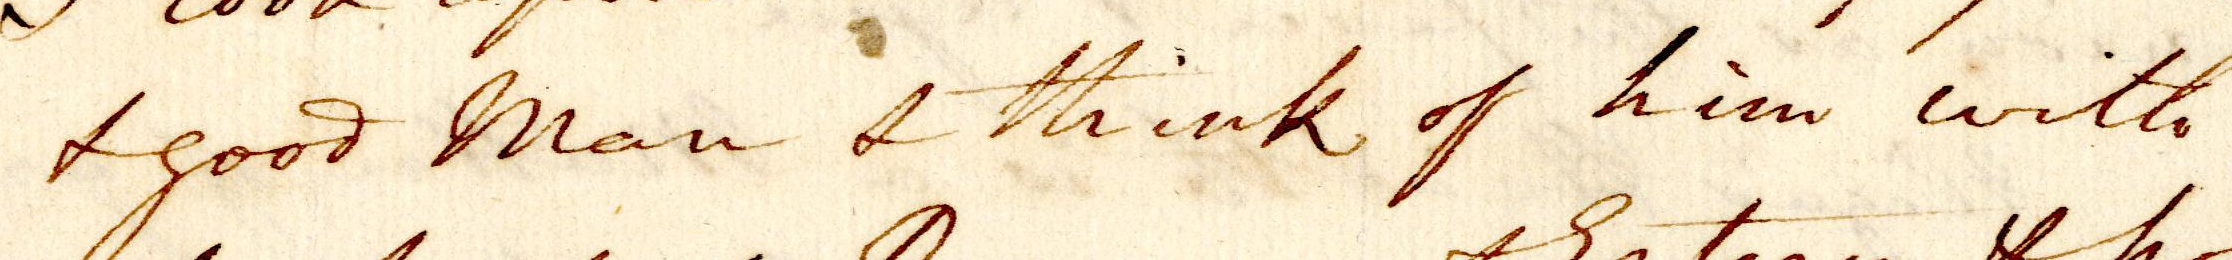& good man I think of him with
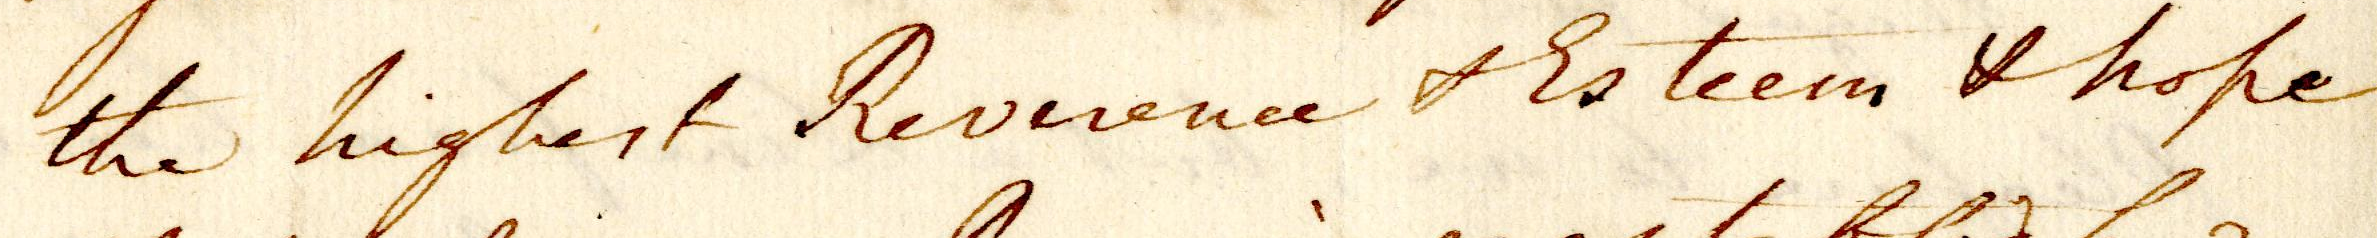the highest Reverence & Esteem & hope
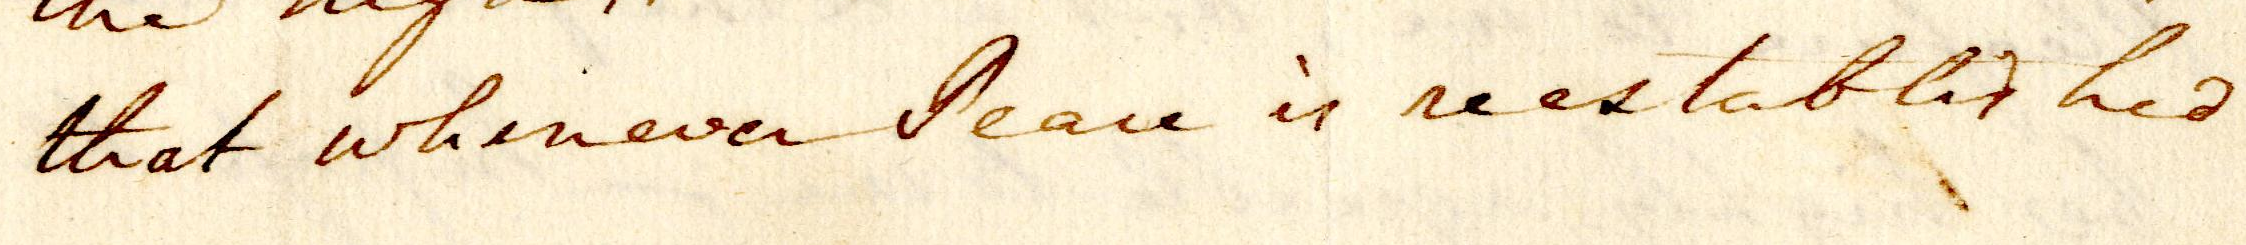that whenever Peace is reestablished
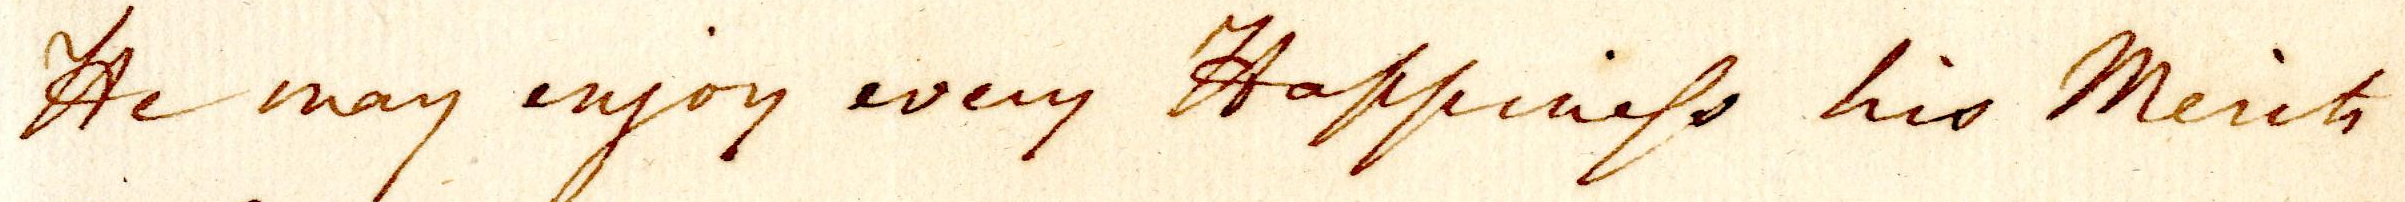He may enjoy every Happiness his Merits
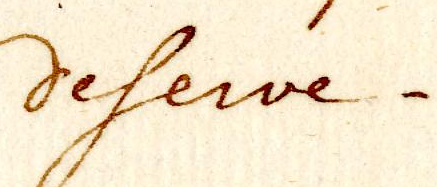deserve.
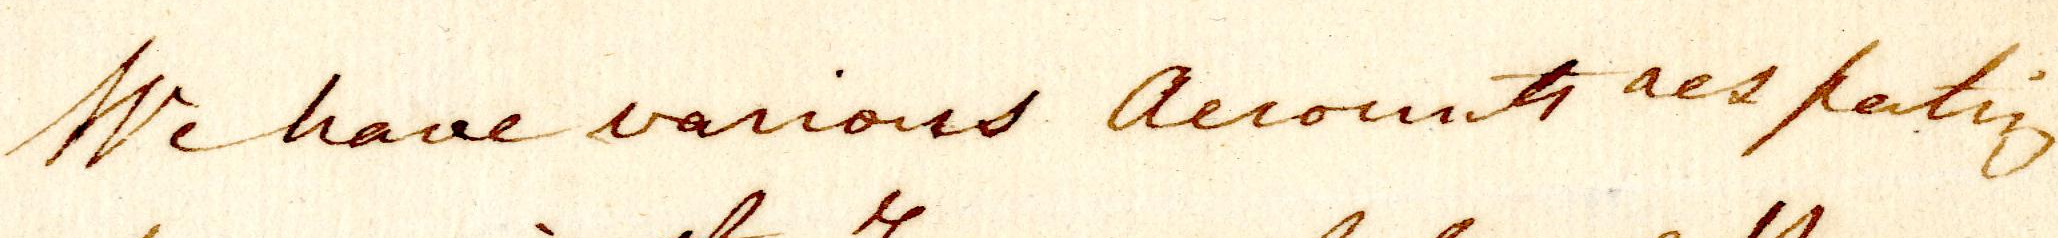We have various Accounts respecting
